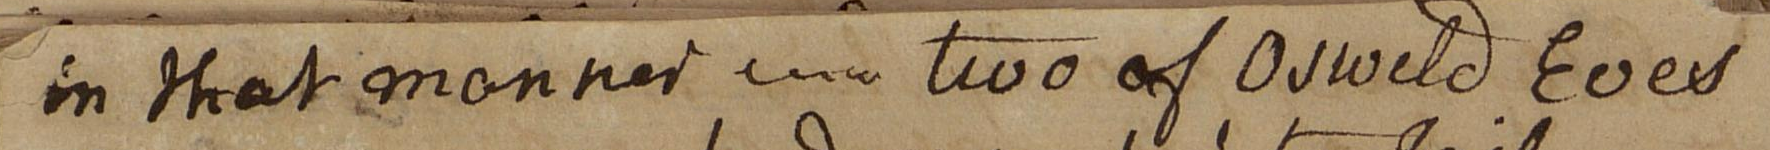in that manner- two of Osweld Eves
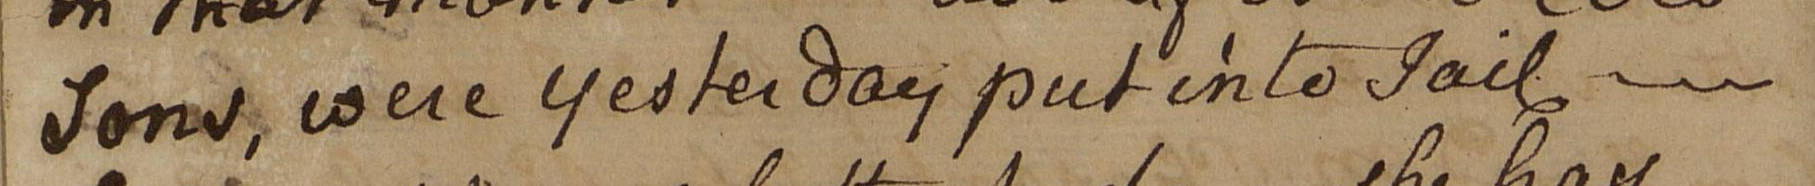Sons, were yesterday put into Jail-
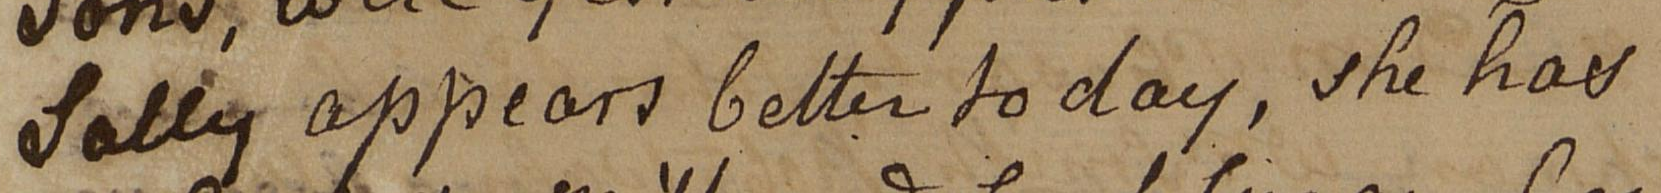Sally appears better to day, she has
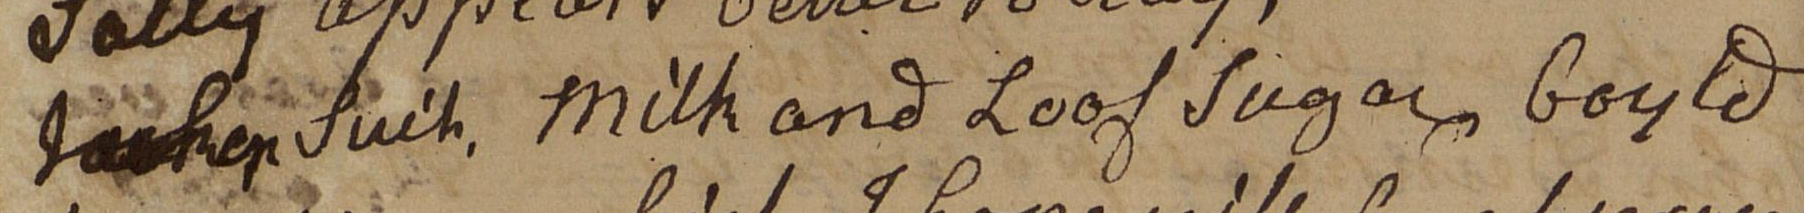tacken Such, Milk and Loof sugar, boyld
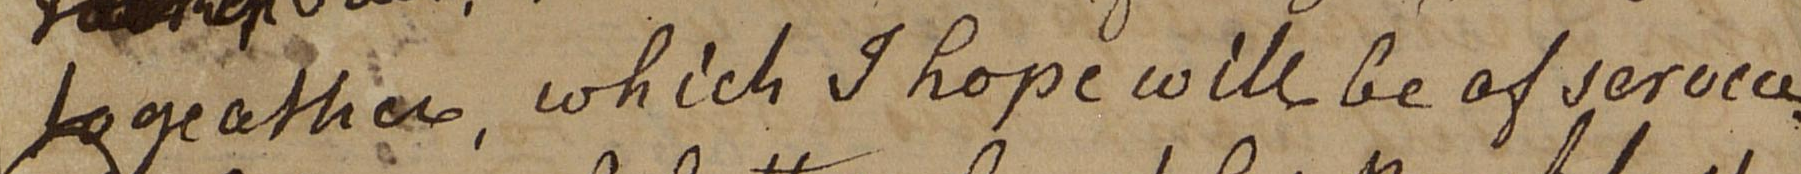togeather, which I hope will be of service
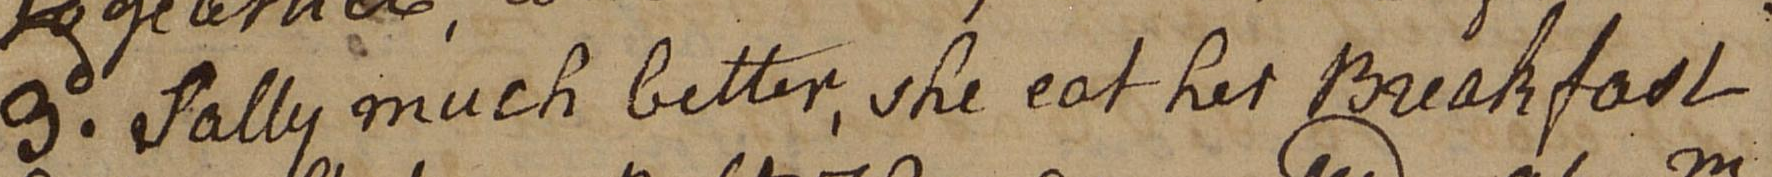3.^d Sally much better, she eat her Breakfast
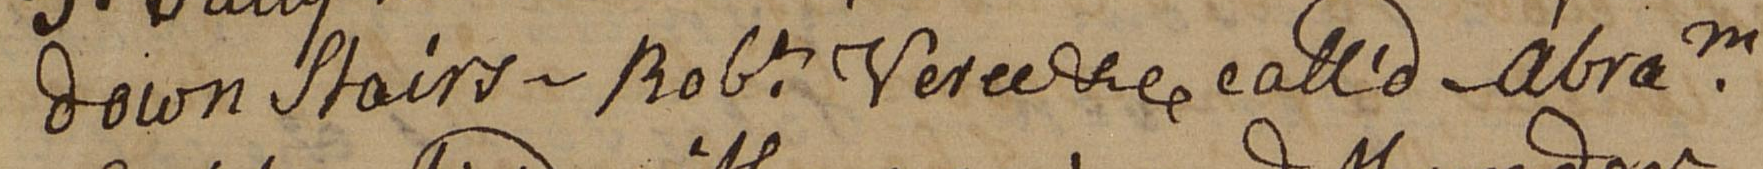down Stairs- Rob^t Veree &c call'd Abra^m.
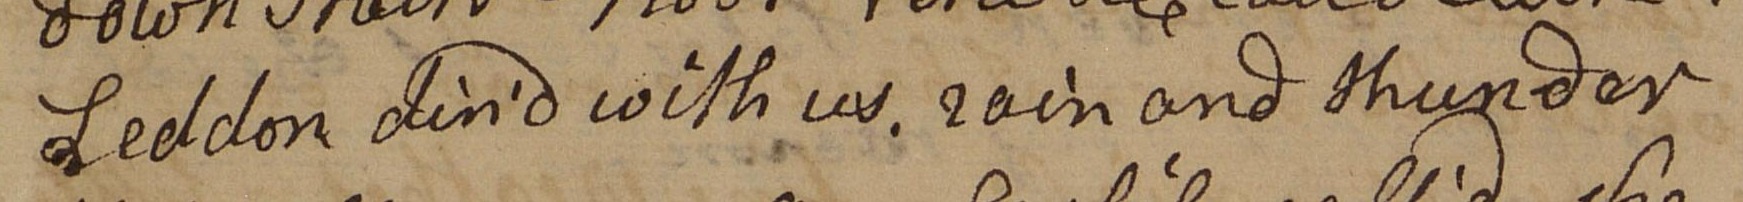Leddon din'd with us, rain and thunder
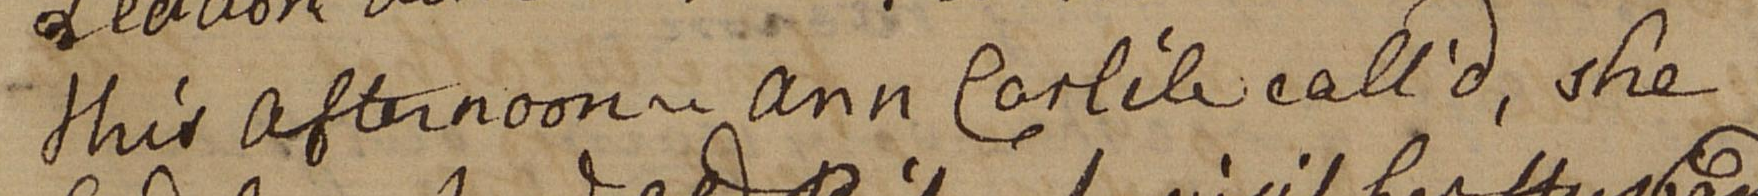this afternoon- Ann Carlile call'd, she
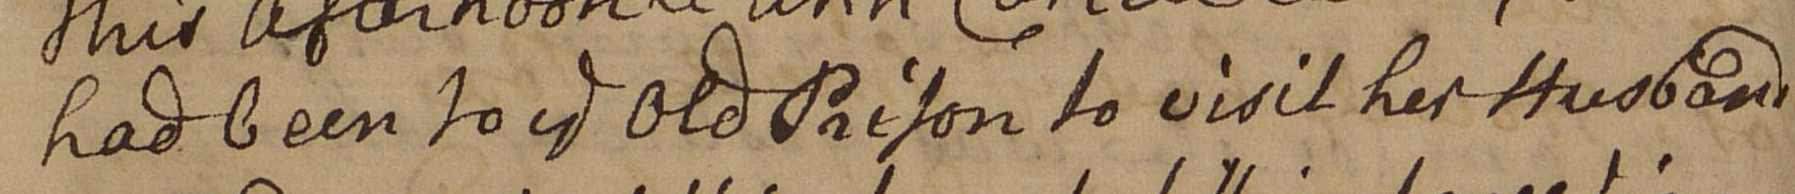had been to y^e old Prison to visit her Husband
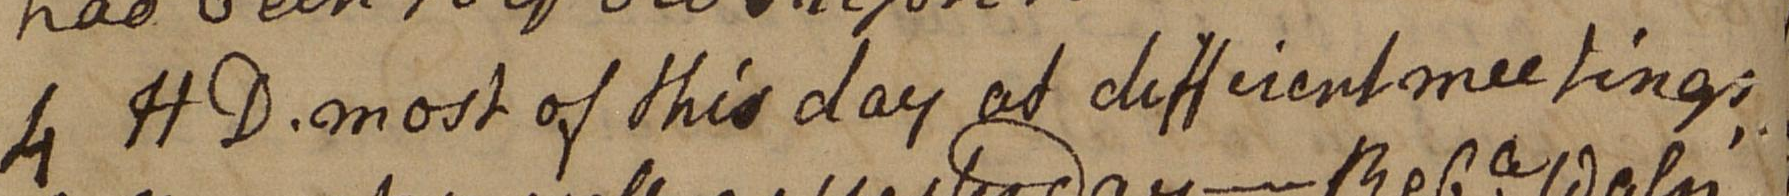4 H D. most of this day at different meetings,
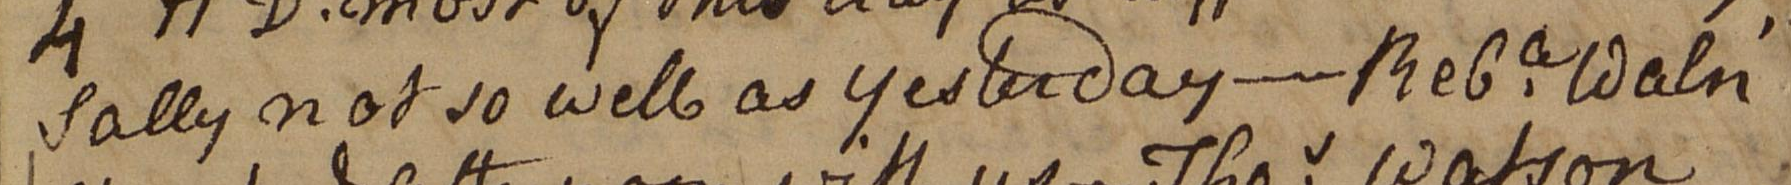Sally not so well as yesterday- Reb^a. Waln
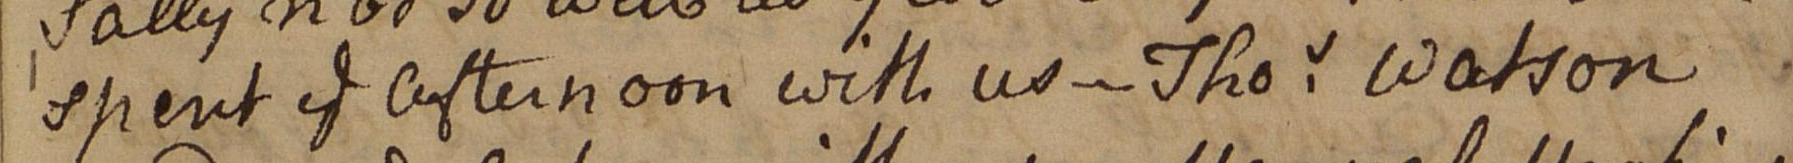spent y^e afternoon with us- Tho.^s Watson
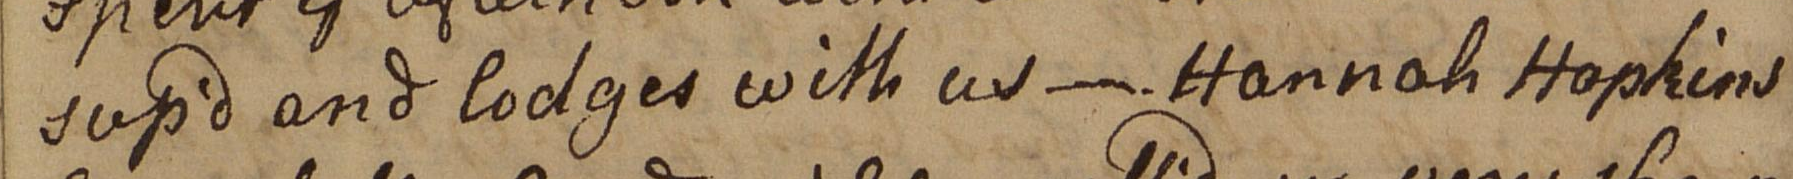sup'd and lodges with us- Hannah Hopkins
